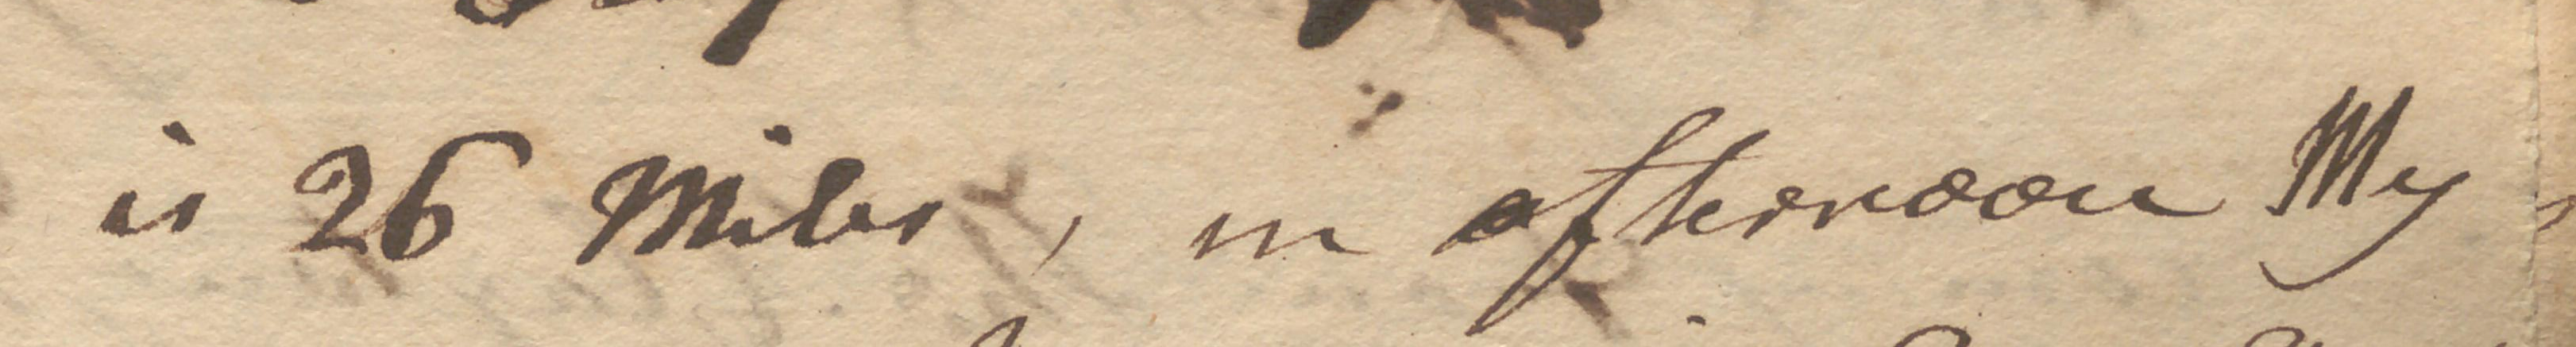is 26 Miles, in afternoon My
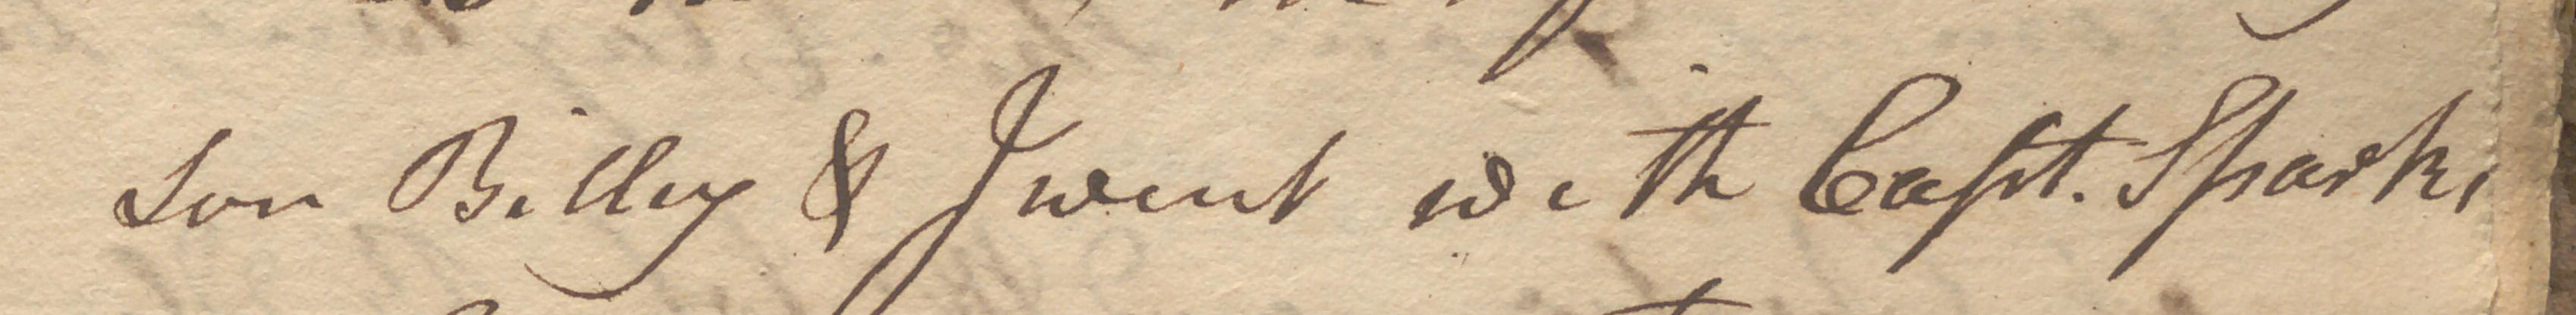Son Billey & I went with Capt. Sparks
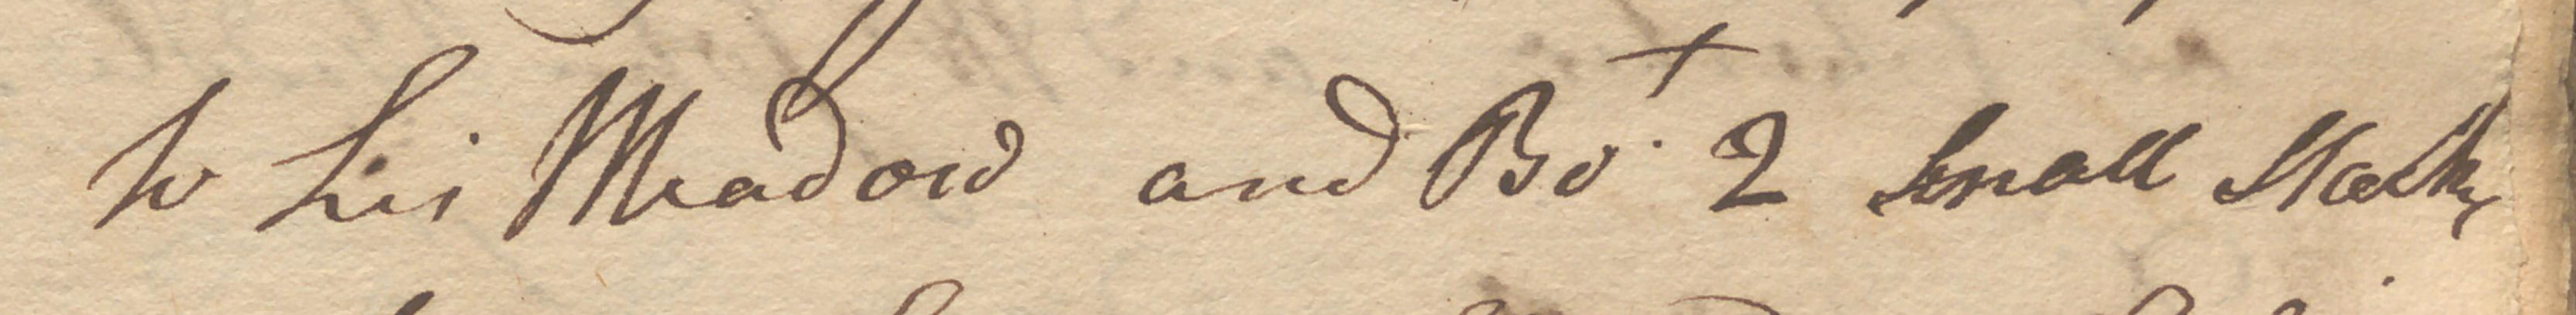to his Meadow and Bo^t. 2 small Stalks
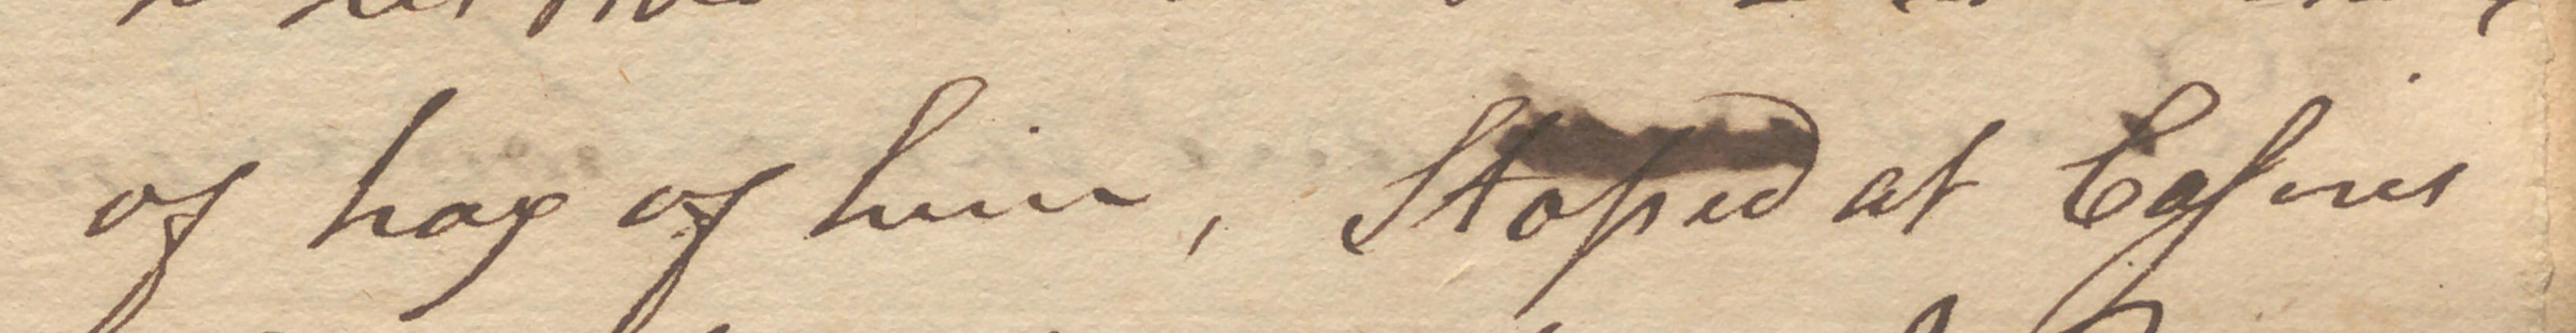of hay of him, Stoped at Cosins
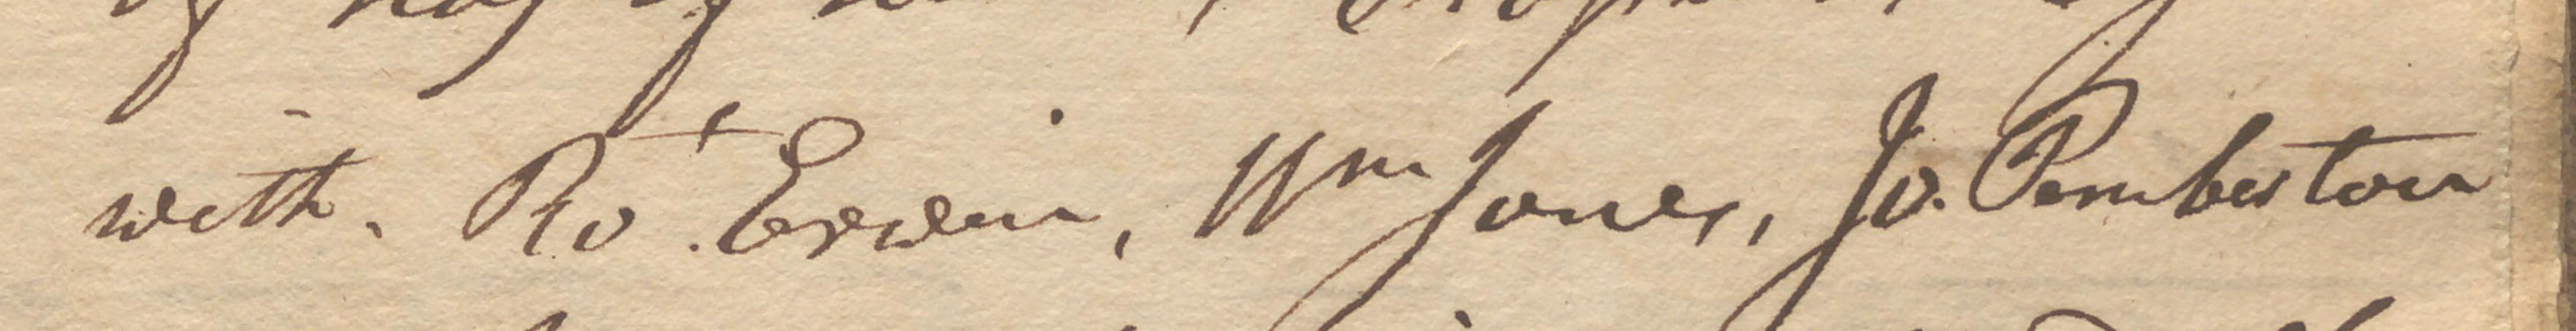with. Ro^t. Erwin, W^m Jones Jo. Pemberton
